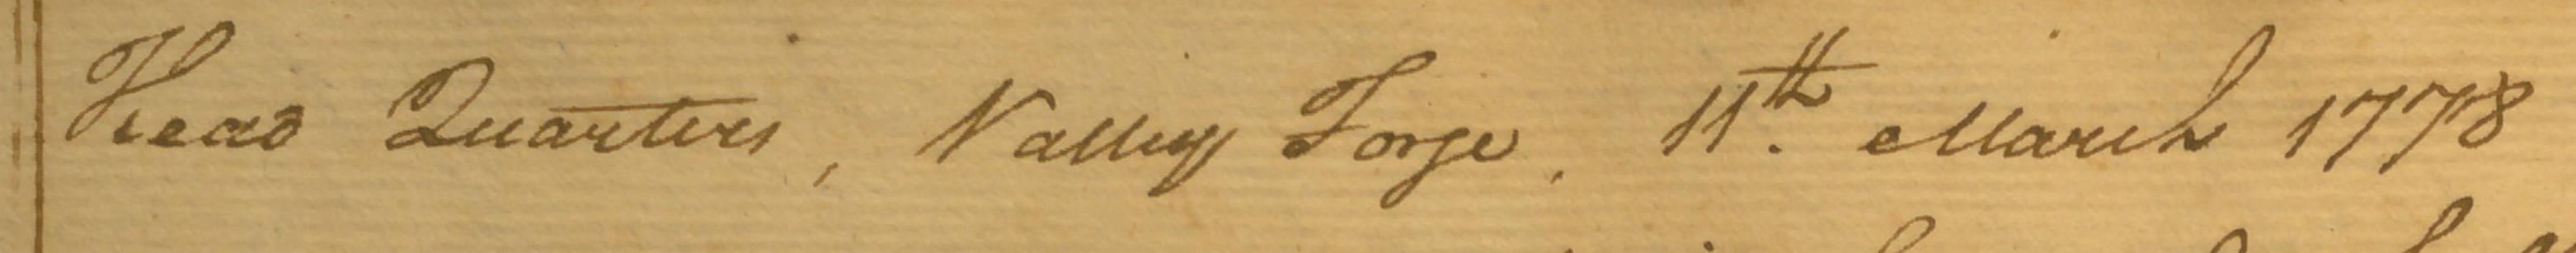Head Quarters, Valley Forge 11^th. March 1778
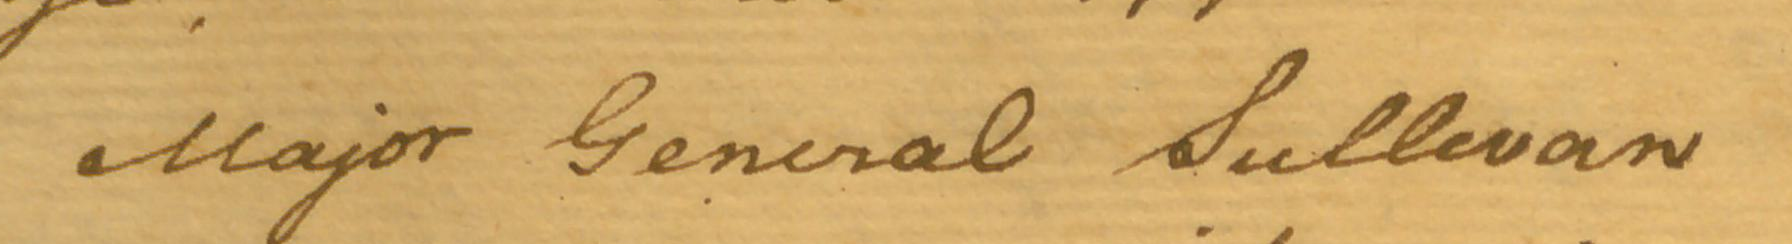Major General Sullivan
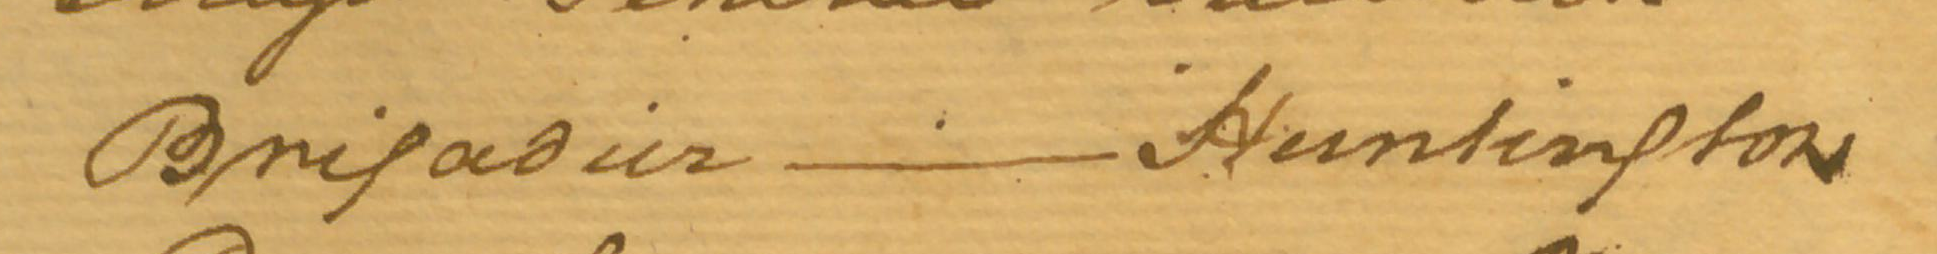Brigadier- Huntington
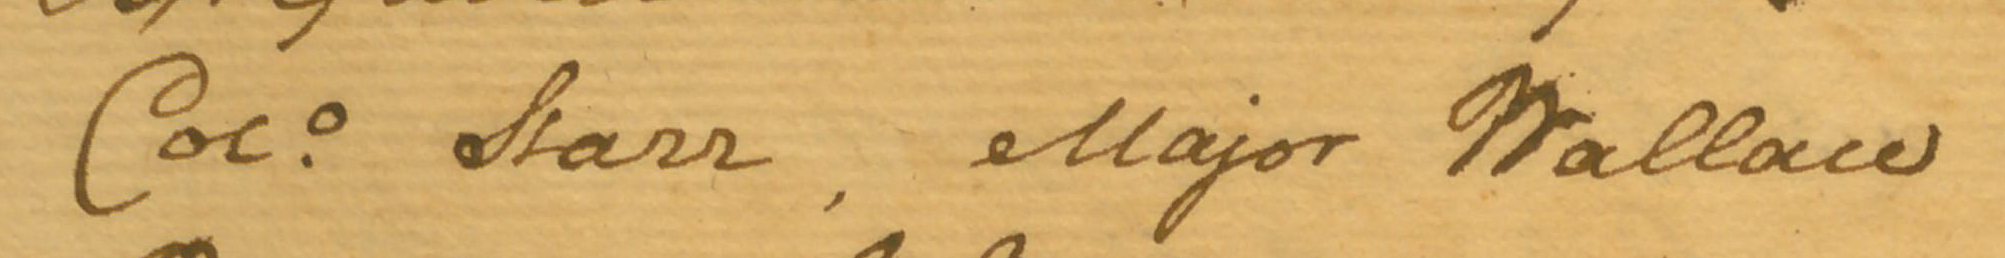Col^o. Starr, Major Wallace
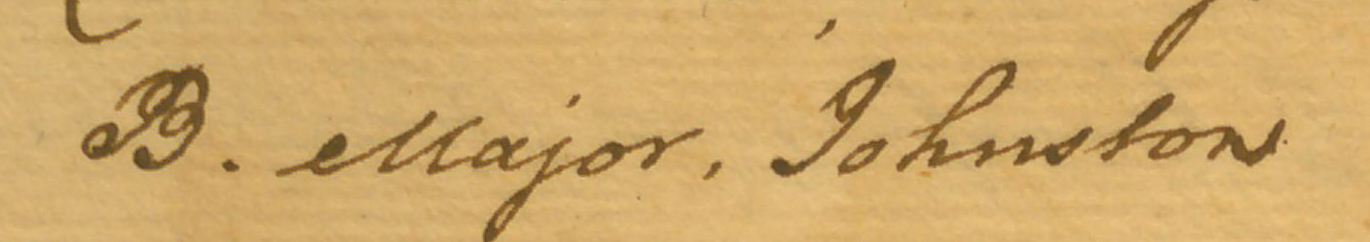B. Major. Johnston
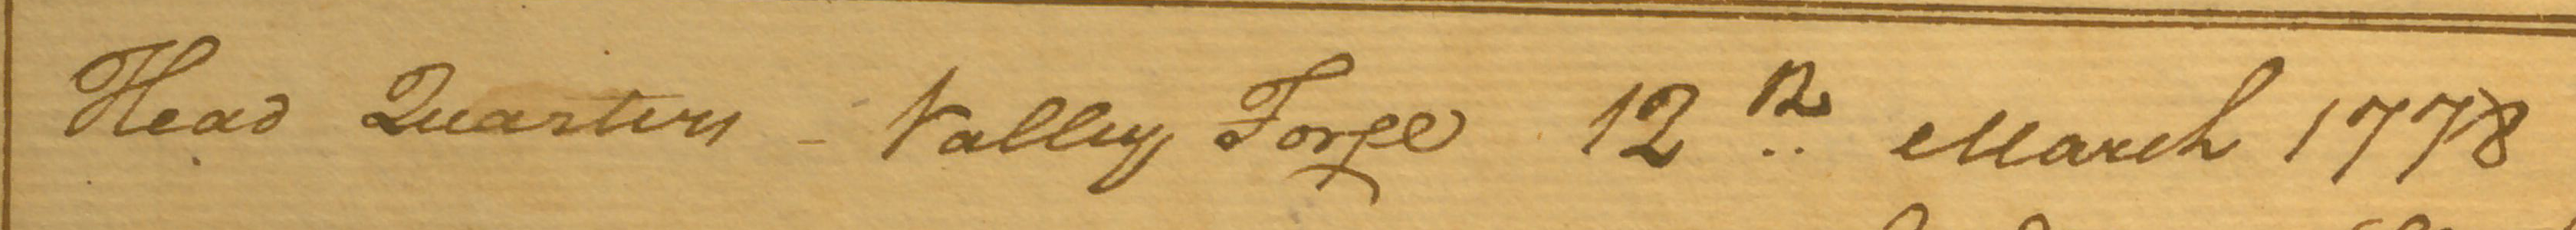Head Quarters- Valley Forge 12^th. March 1778
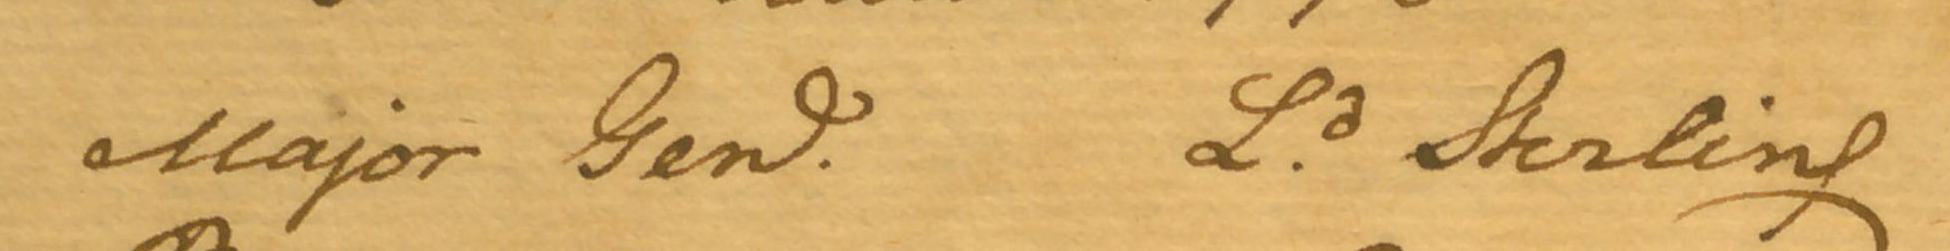Major Gen^l. L^d. Sterling
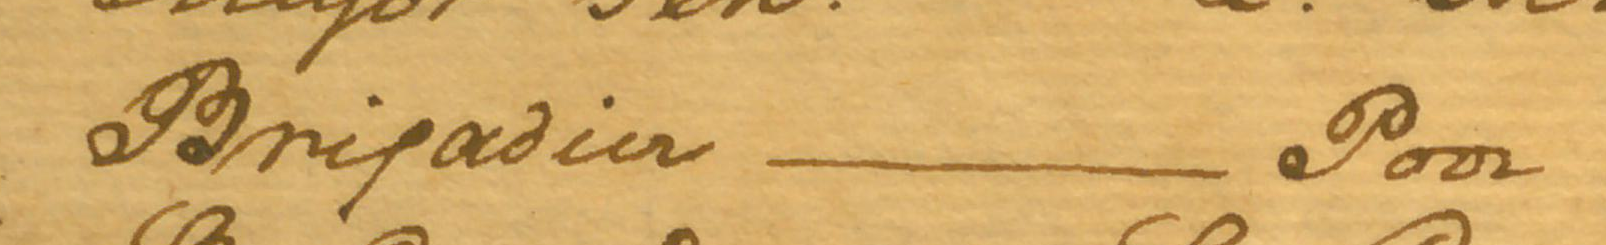Brigadier- Poor
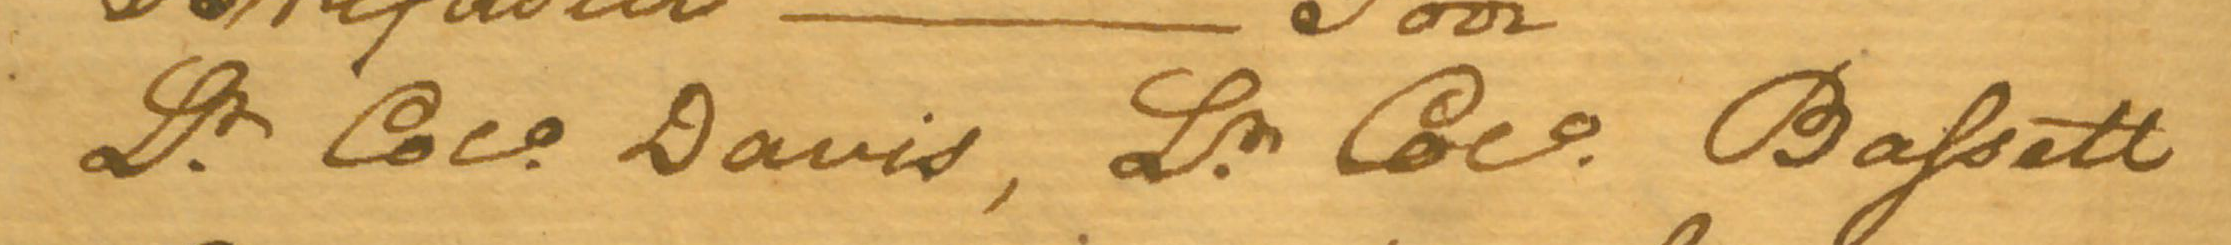L^t. Col^o. Davis, L^t. Col^o. Bassett
